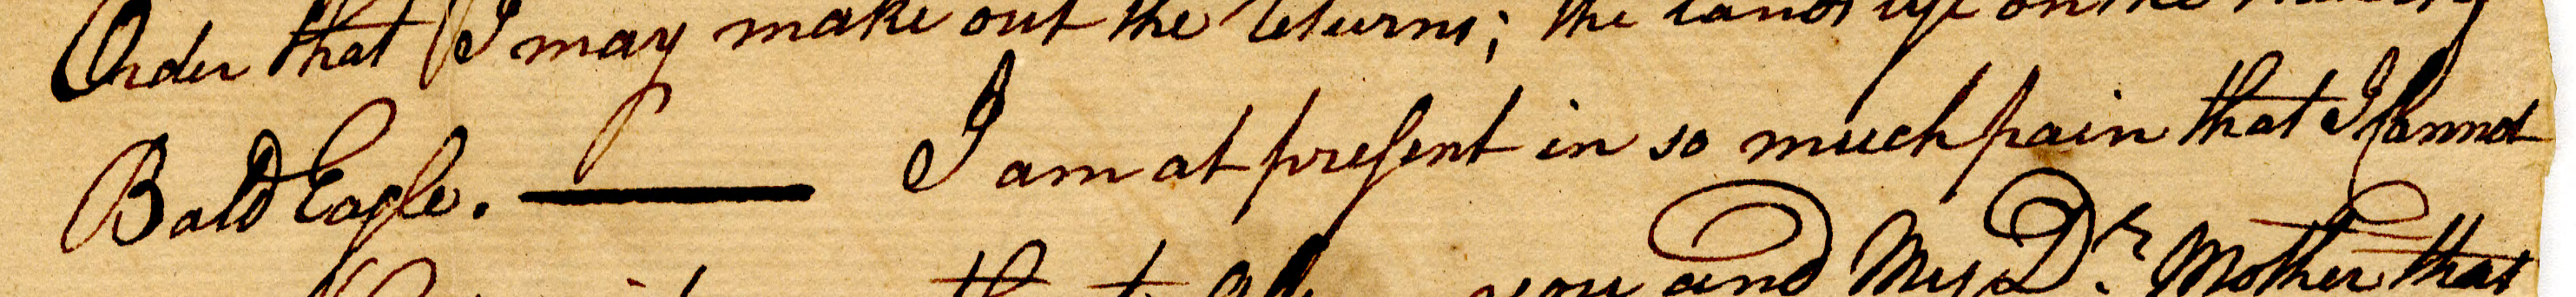Bald Eagle.- I am at present in so much pain that I cannot
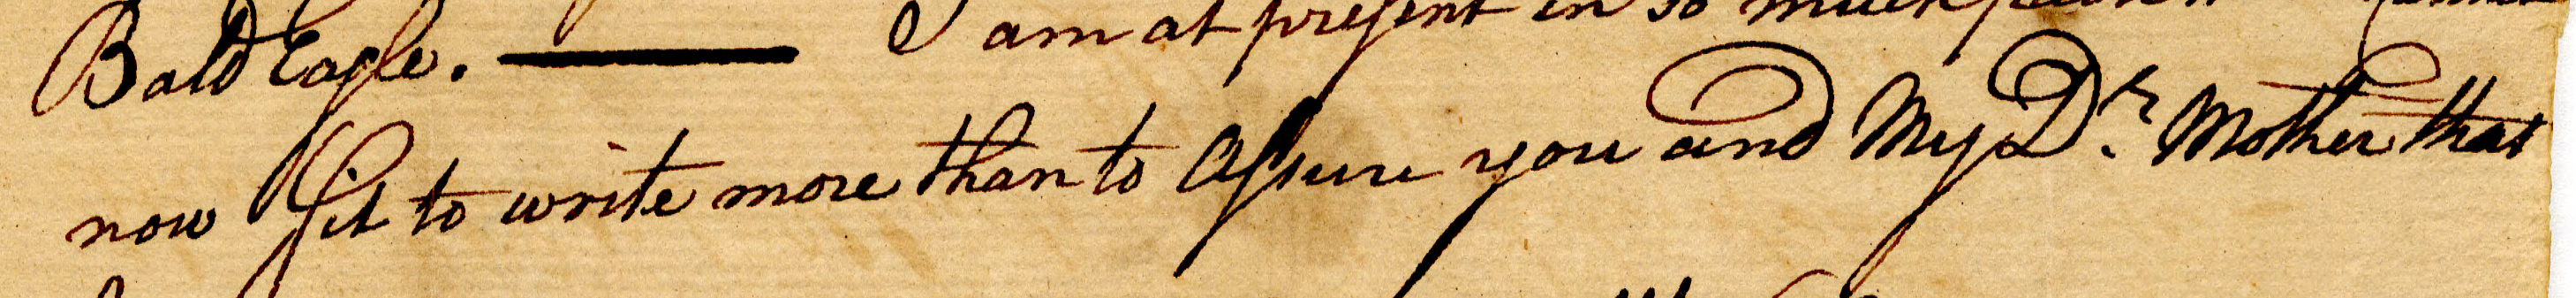now sit to write more than to assure you and my D^r. mother that
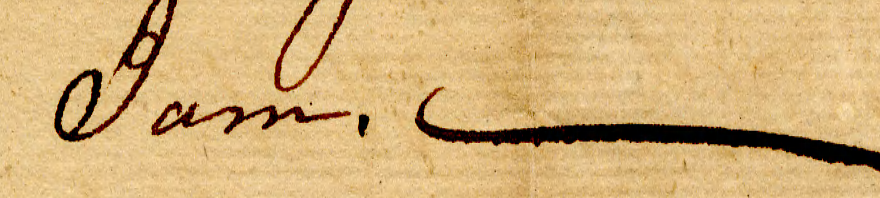I am,-
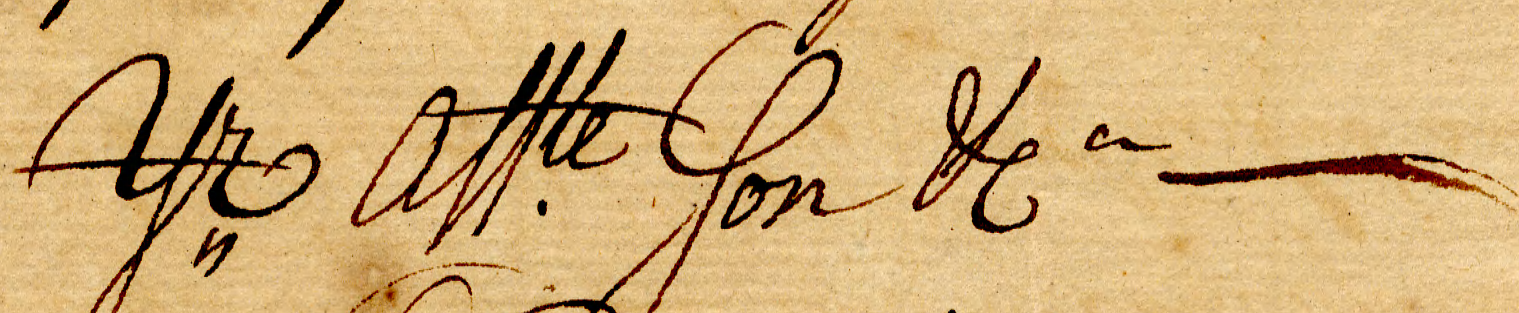Y^r. Aff^e. Son &c^a-
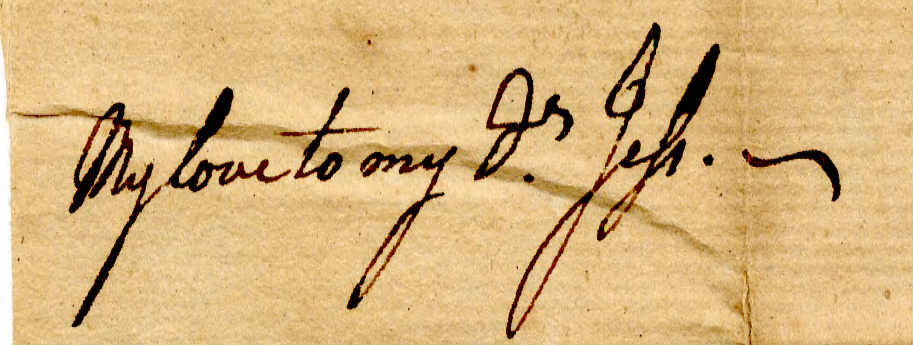My Love to my d^r. Jess.-
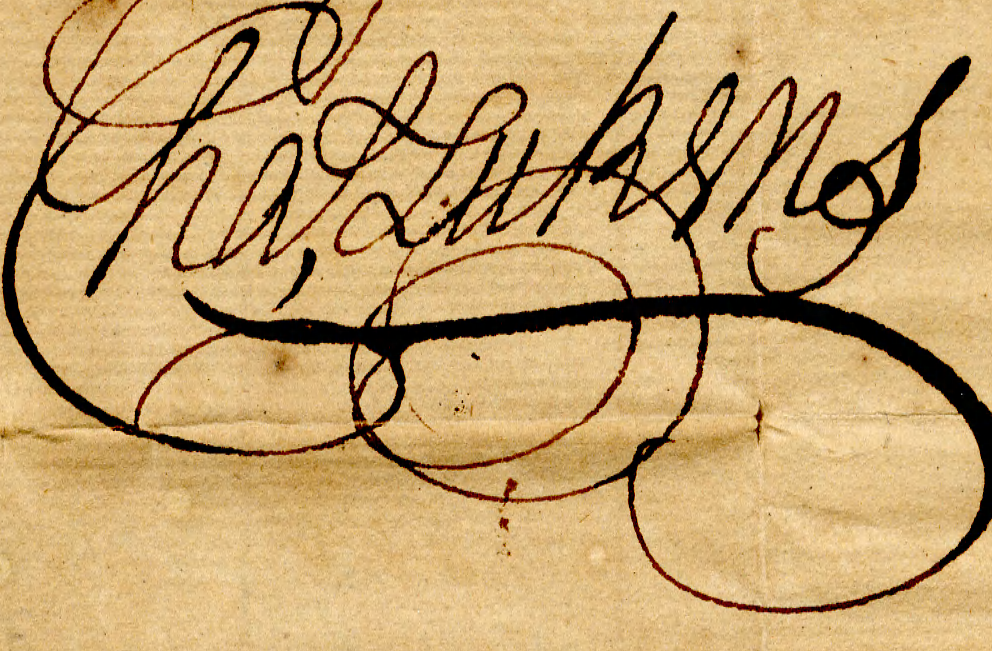Chas. Lukens
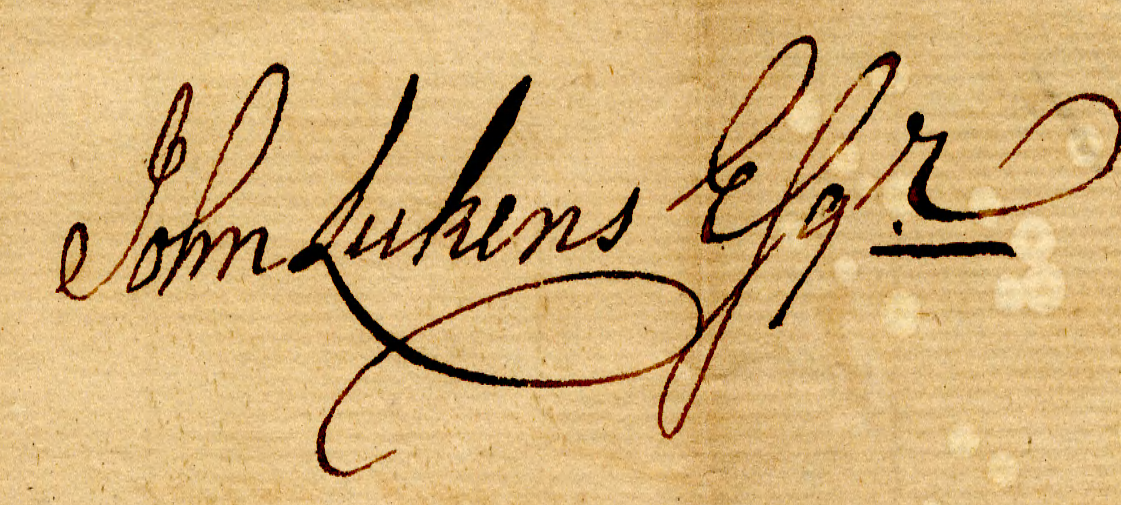John Lukens Esq^r.
